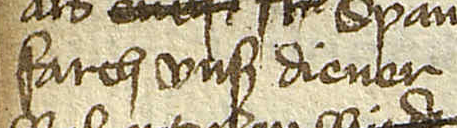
farch vnſ* diener
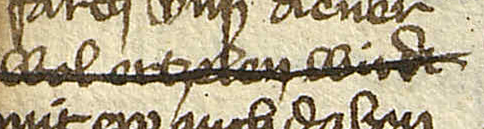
wol ertʒelen wirdt
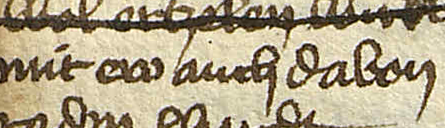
mit ew auch davon
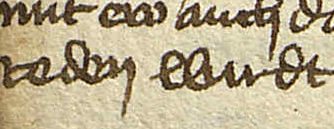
reden wurdt
